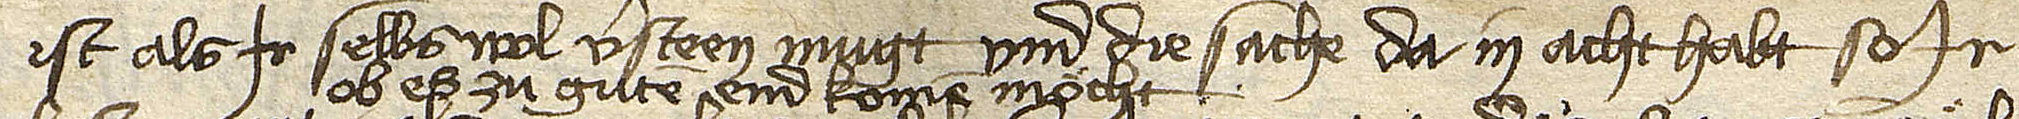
iſt als Ir ſelbs wol v*ſteen mugt vnd die ſache da in acht habt ſo Ir
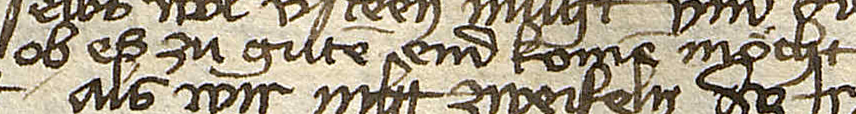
ob es ʒu gute* end kome* möcht
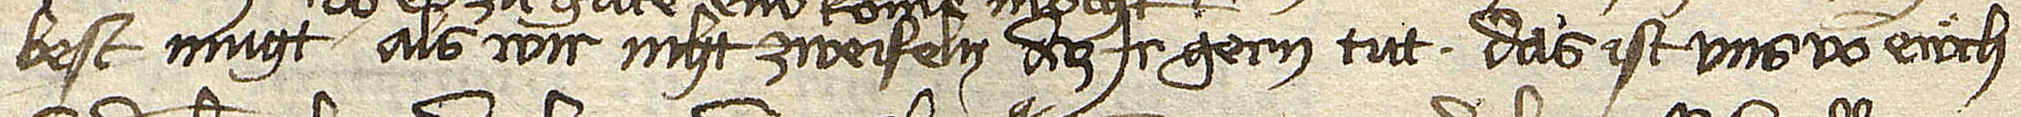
beſt mugt / als wir niht ʒweifeln daʒ Ir gern tut . das iſt vns vo* eẅch
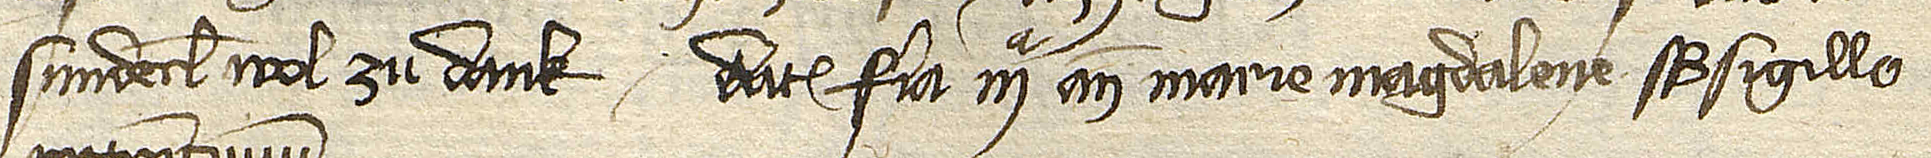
ſunderl* wol ʒu dank* / Dat* fi*a ii* an* marie magdalene . ſ* ſigillo
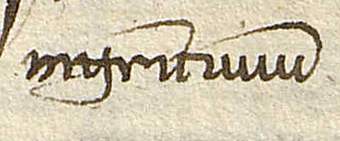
m*griciuiu*
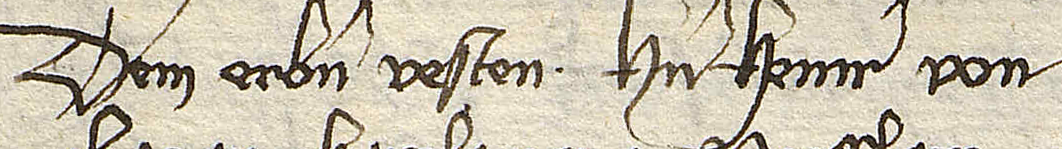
Dem erbn* veſten . Hn* Heinr* von
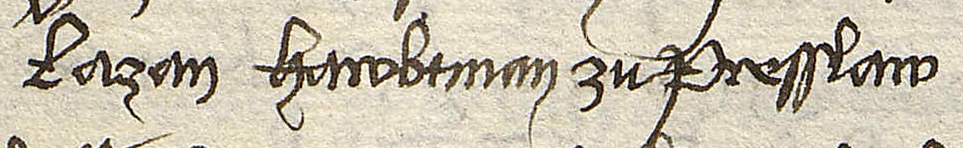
Laʒan Hawbtman ʒu Preſſlaw
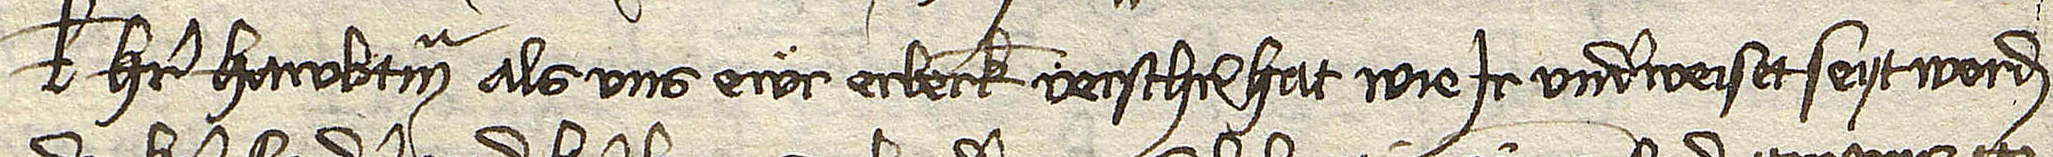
L* hr* hawbtm* als vns eẅr erberk* verſchr* hat wie Ir vnd*weiſet ſeyt word*
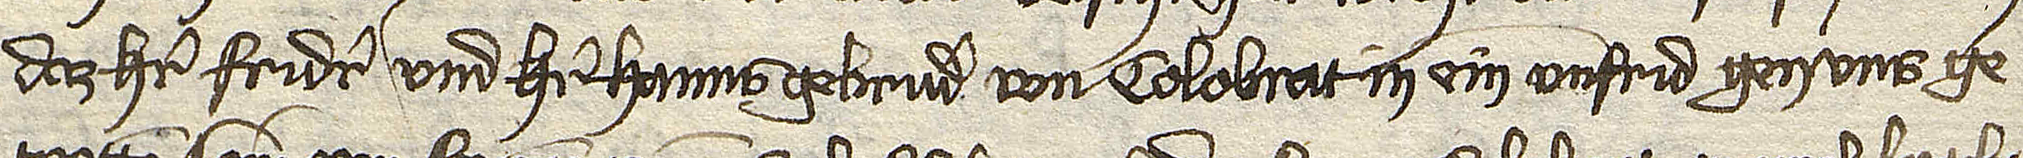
daʒ hr* fridr* vnd hr* hanns gebrud* von Colobrat in ein* vnfrid gen vns ge
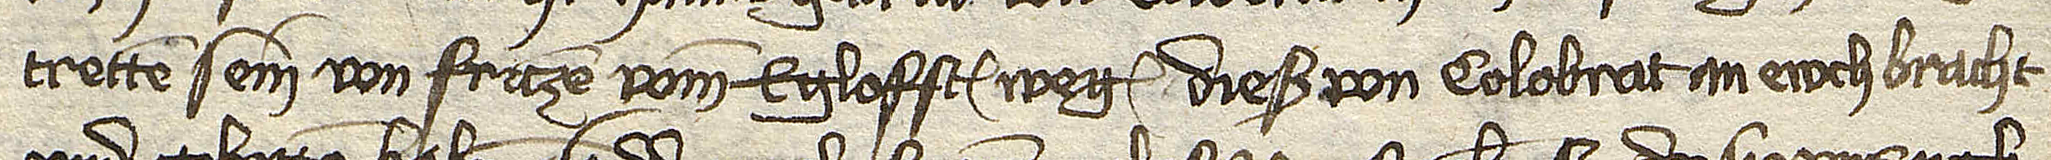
trette* ſein von fricʒe* vom* Eglofſt* weg* dieſ* von Colobrat an ewch bracht
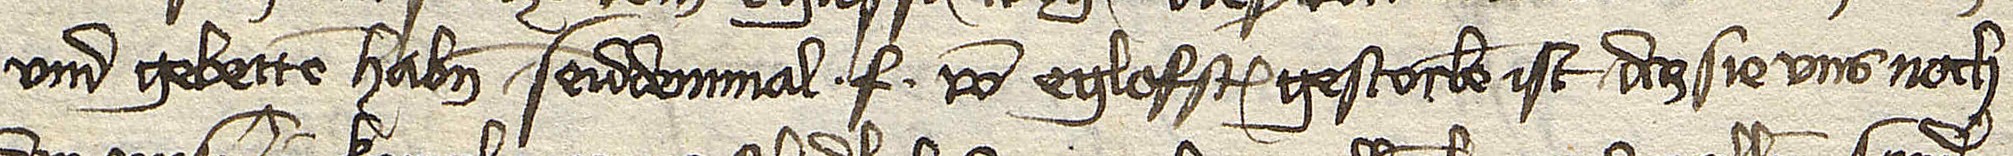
vnd gebette* habn* / ſeiddemmal . f . vo* eglofſt* geſtorbe* iſt / daʒ ſie vns noch
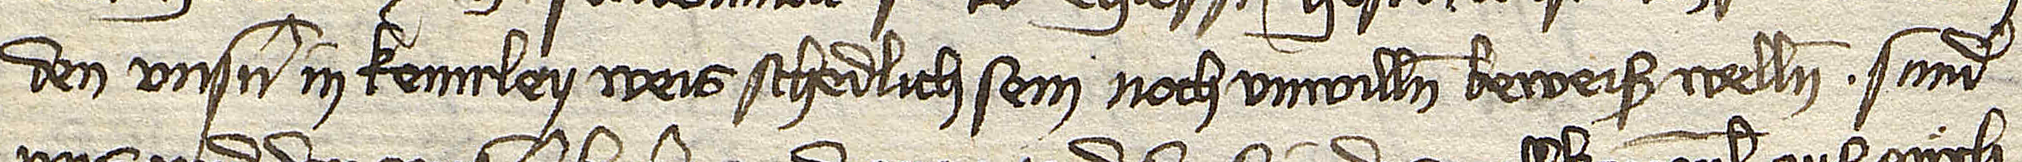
den vnſn* in keinrley weis ſchedlich ſein noch vnwilln* beweiſ* welln* . ſund*
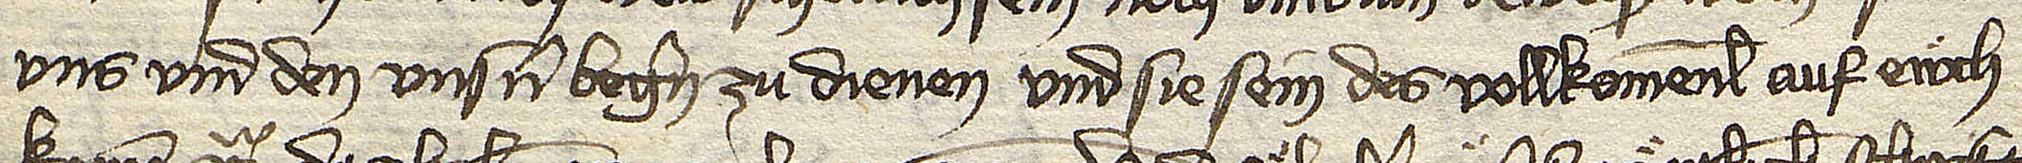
vns vnd den vnſn* beg*n ʒu dienen vnd ſie ſein des vollkomenl* auf eẅch
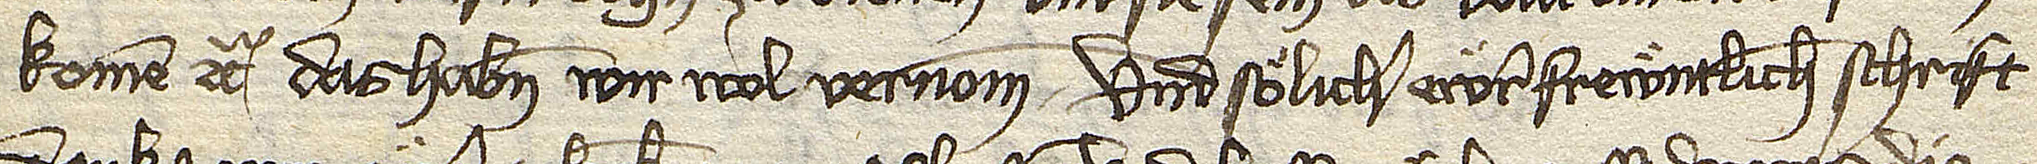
kome* ec* das habn* wir wol vernom* / Vnd ſölich* eẅr* freẅntlich* ſchrift
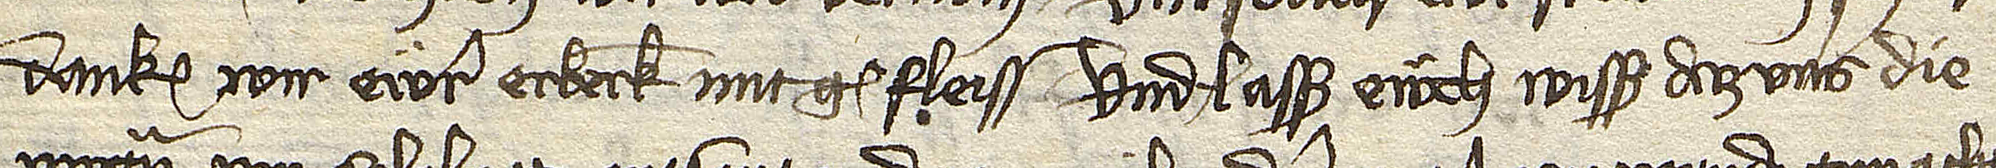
Dank* wir eẅr* erberk* mit g* fleiſſ / Vnd laſſ* eẅch wiſſ* daʒ vns die
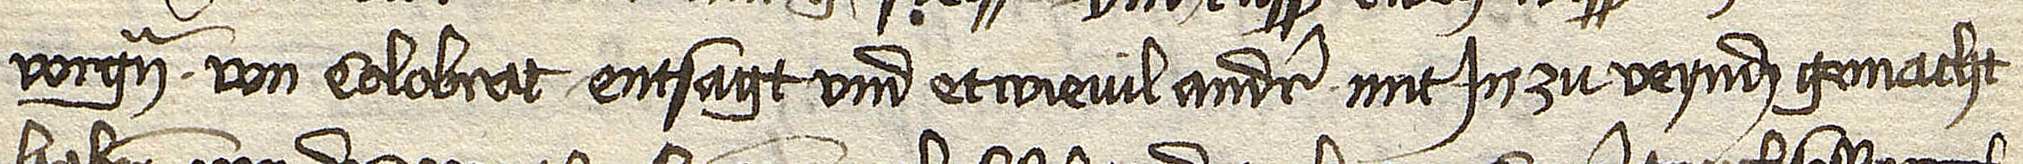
vorgn* . von Colobrat / entſagt vnd etwieuil andr* . mit In ʒu veynd* gemacht
